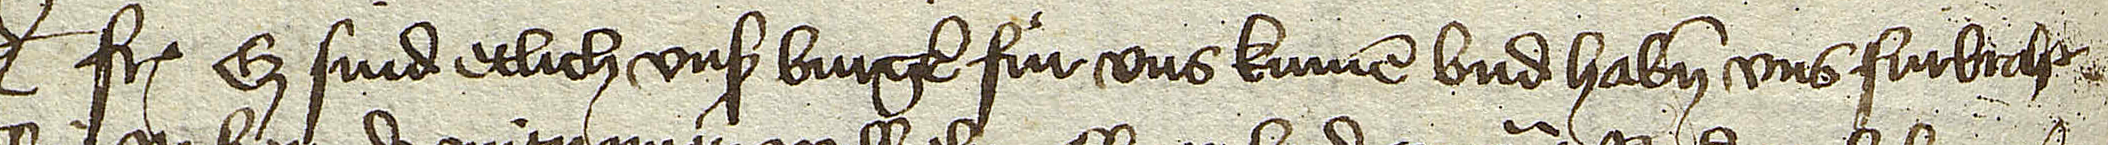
L* fr* Eʒ ſind etlich vnſ* burge* für vns kume* vnd habn* vns furbraht
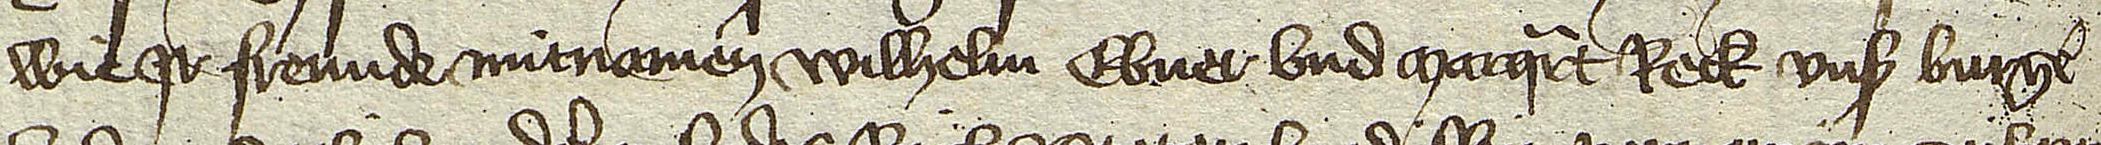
wie Ir freunde mitnamen wilhelm Ebner vnd Marqrt* Reck vnſ* burge*
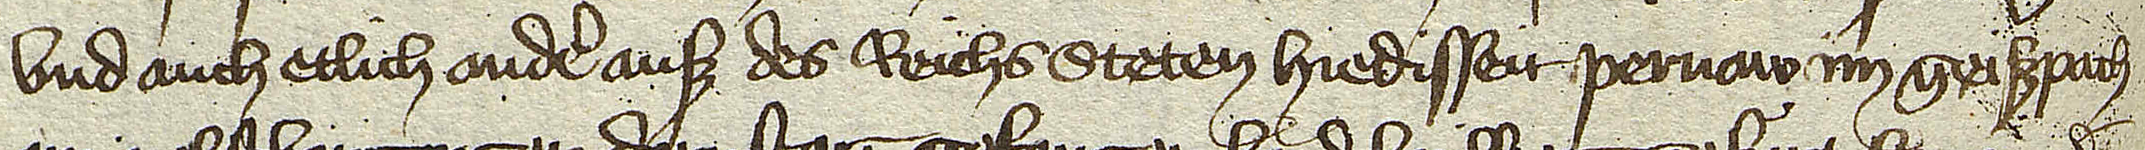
vnd auch etlich ande* auſʒ des Reichs Steten hiediſſeit pernaw im geiſʒpach
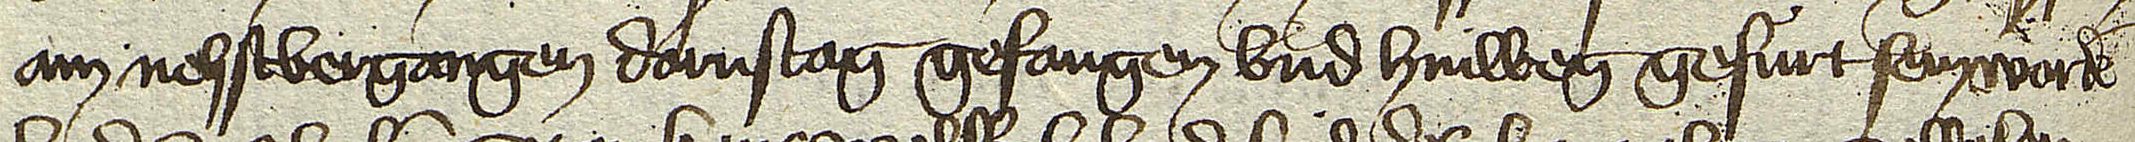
am nehſtvergangen dornſtag gefangen vnd hinweg gefürt ſein worde*
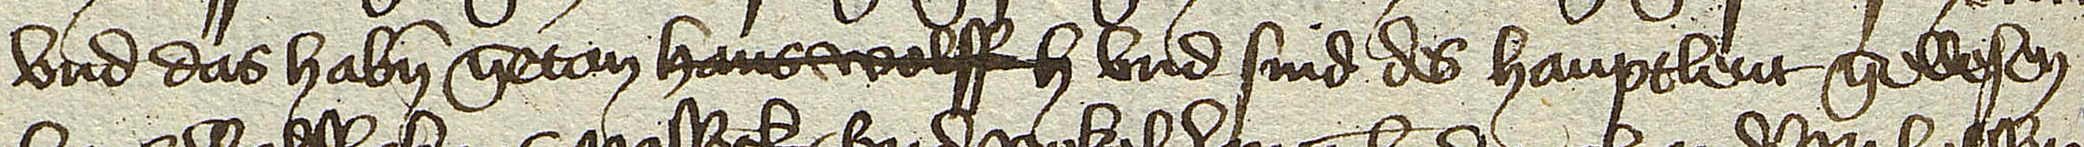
vnd das habn* getan hans wolff h vnd ſind des hauptleit geweſen
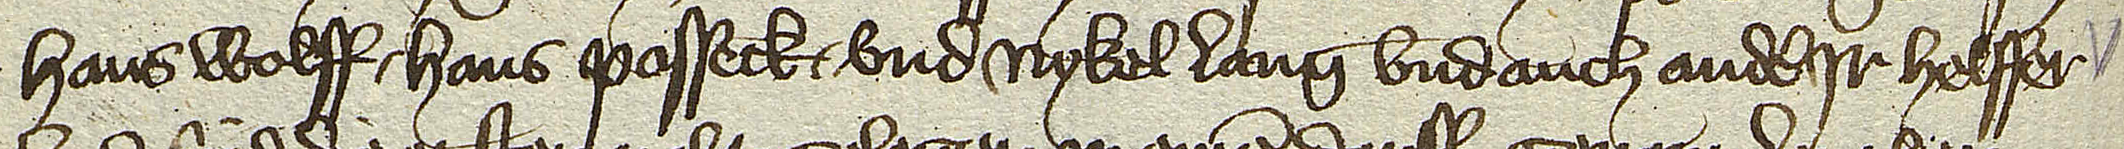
hans wolff / hans poſſeck / vnd Nykel lang vnd auch ande* Ir helffer
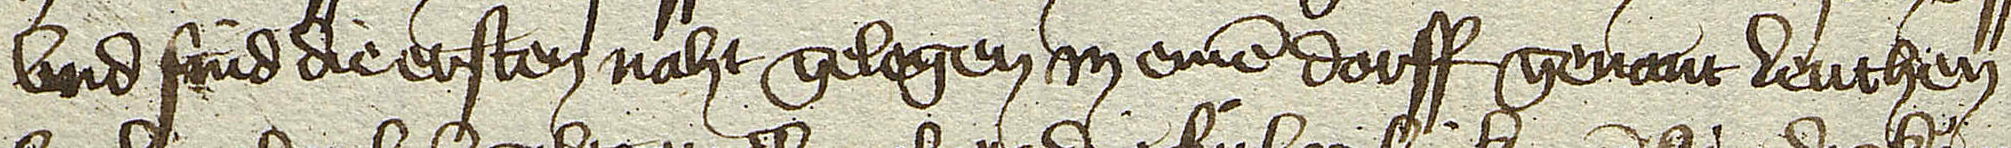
vnd ſind die erſten naht gelegen in eine* dorff genant leuthen
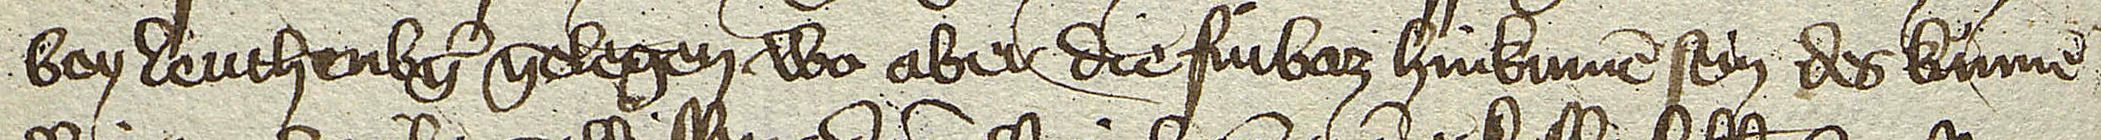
bey leuthenbg* gelegen / wo aber die fürbaʒ hinkume* ſein des künne*
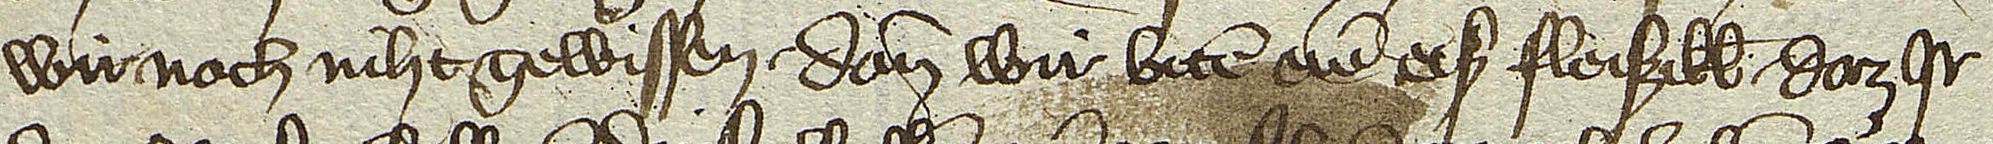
wir noch niht gewiſſen / dan* wir bite* ew* erſ* fleiſʒikl* / daʒ Ir
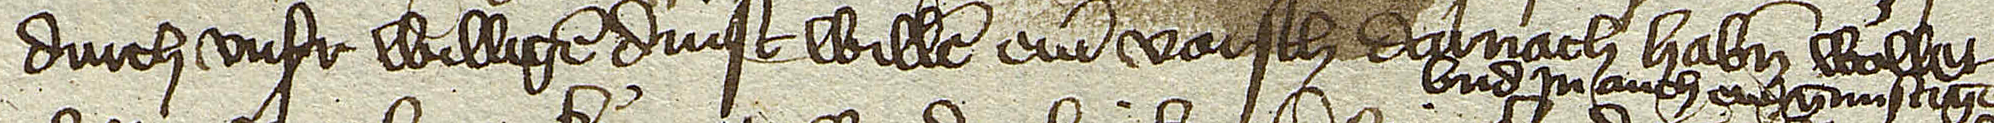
durch vnſ*r willige* dinſt wille* ew* vorſch darnach habn* wöllet
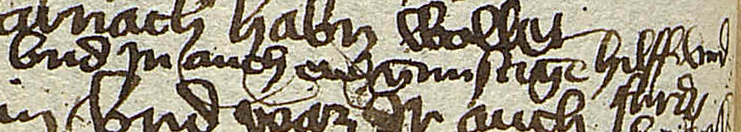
vnd In auch ew* gunſtige hilff vnd
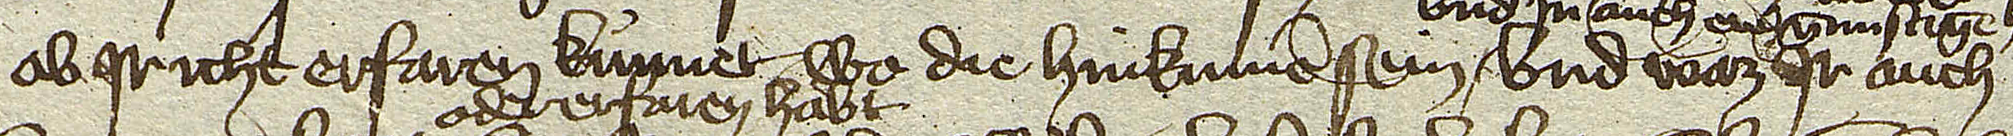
ob Ir erfaren künnet wo die hinkume* ſein / vnd waʒ Ir auch
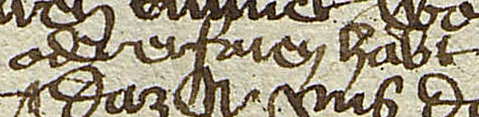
oder erfaren habt
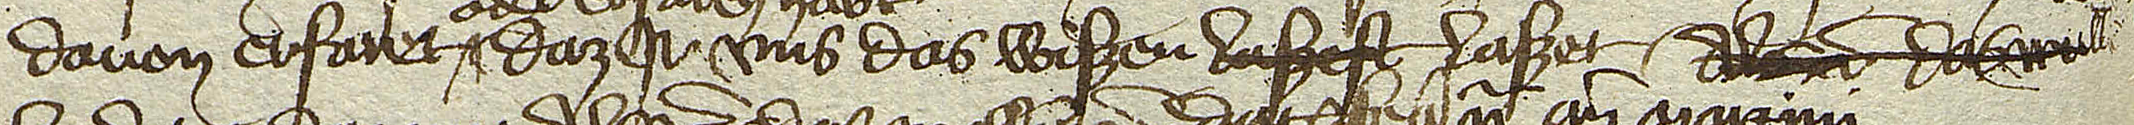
dauon erfaret daʒ Ir vns das wiſʒen laſʒeſt laſʒet / Als ec* das wolle
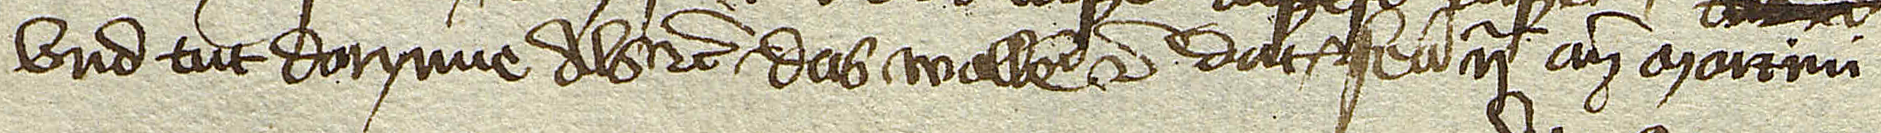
vnd tut dorynne Als ec* / das wolle* ec* dat* fea* ii* an* Martini
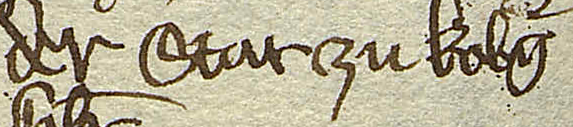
der Stat cʒu kob*g
